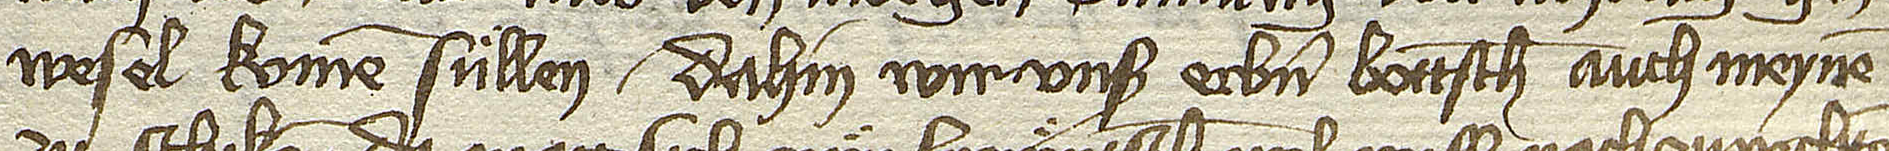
weſel kome* ſüllen / Dahin wir vnſ* erb*n bottſch* auch meyne*
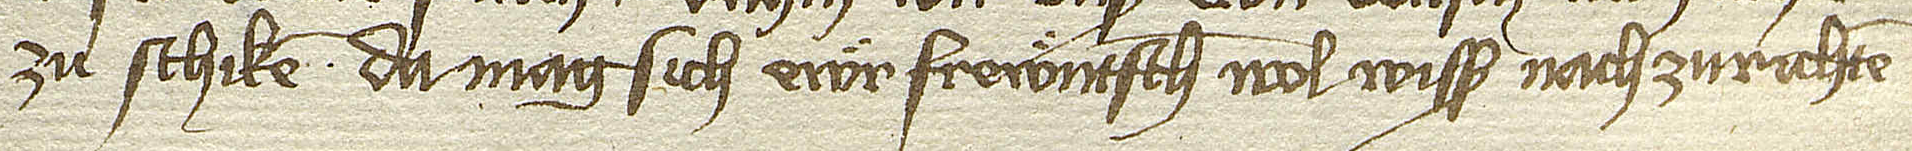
ʒu ſchike* . da mag ſich eẅr freẅntſch* wol wiſſ* nach ʒurichte*
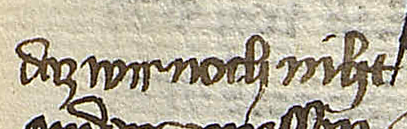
daʒ wir noch niht
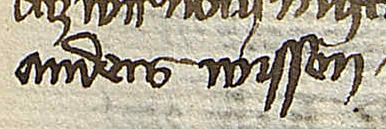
anders wiſſen
